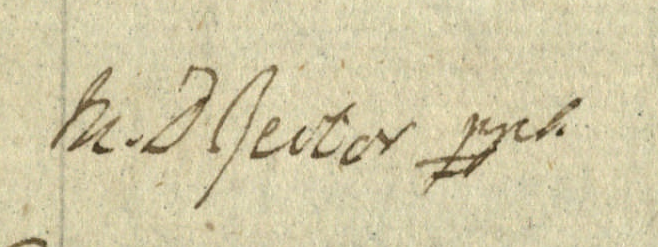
M. D Rector ppt
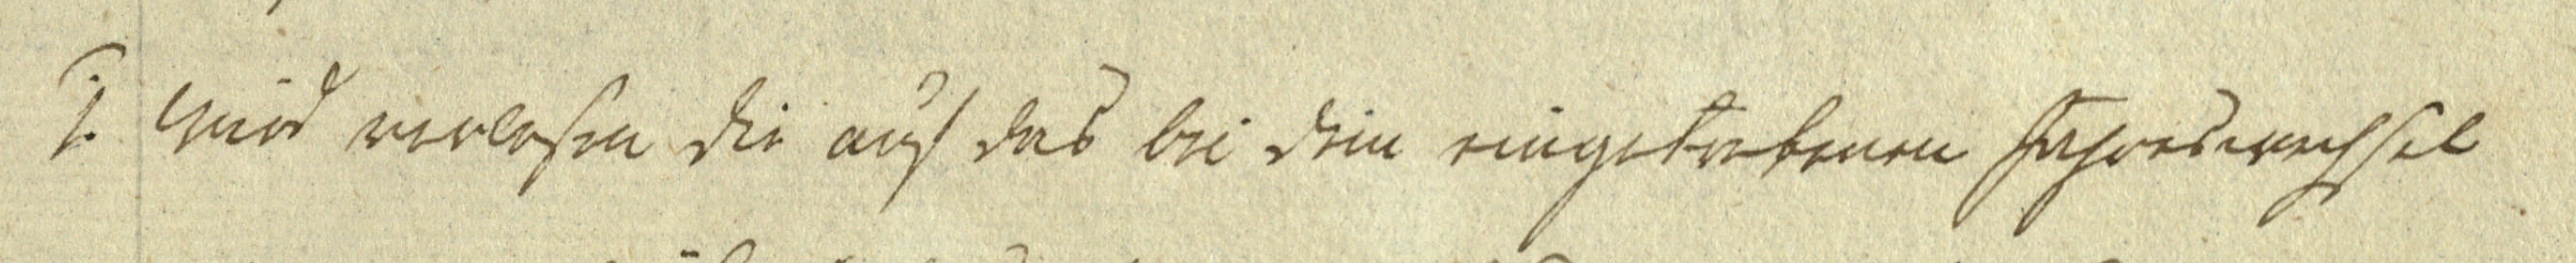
1. Wird verlesen die auf das bei dem eingetretenen Jahreswechsel
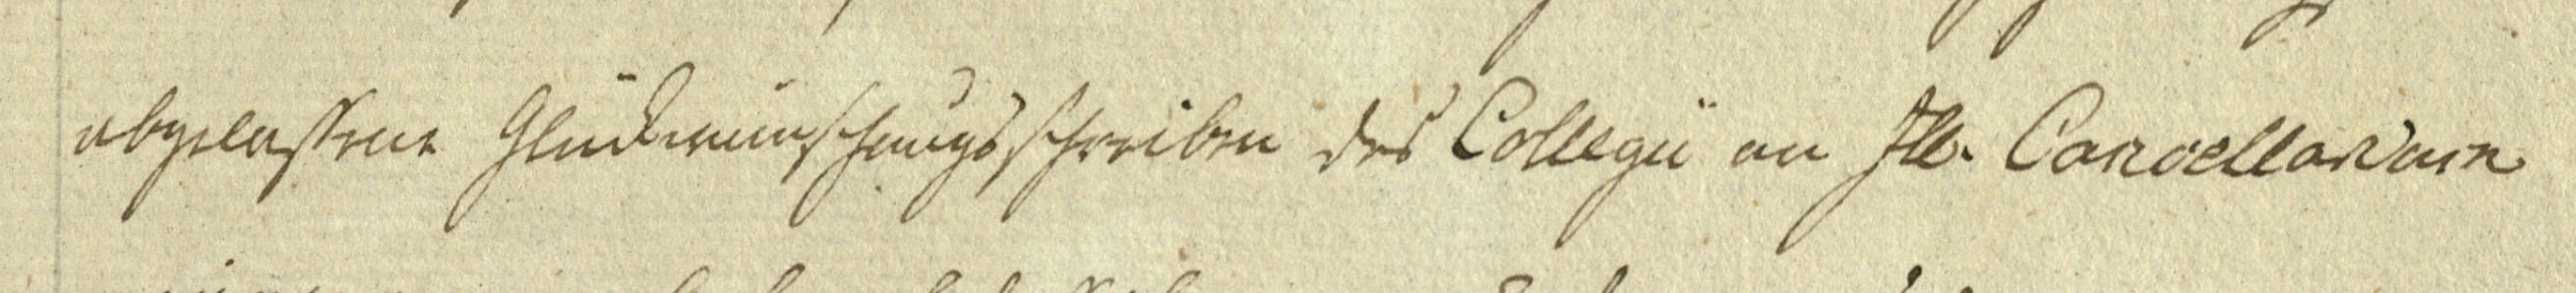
abgelassene Glückwünschungsschreiben des Collegi an Ill. Cancellarium
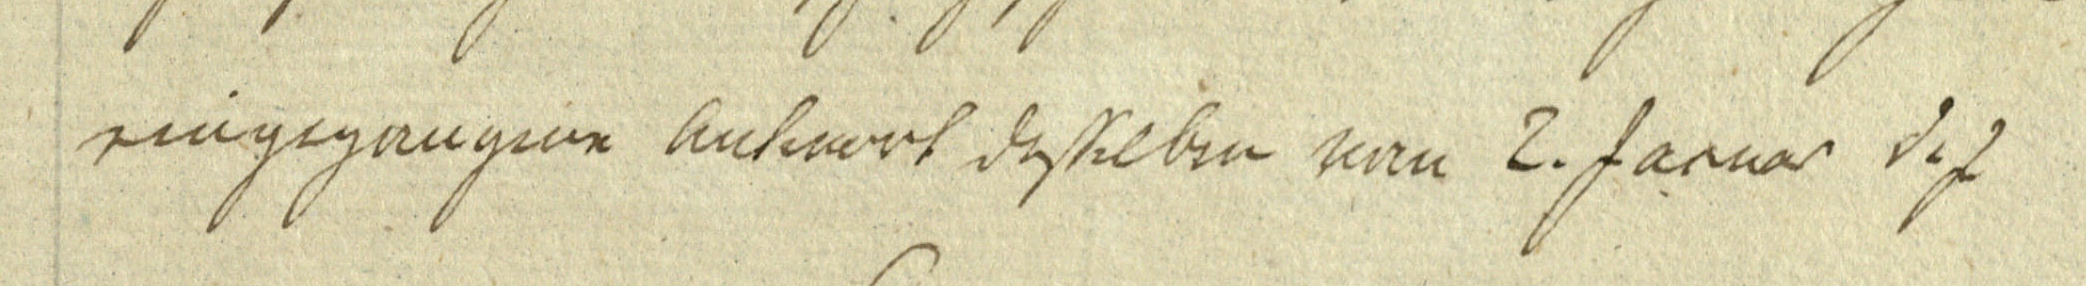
eingegangene Antwort desselben vom 2. Januar d. J.
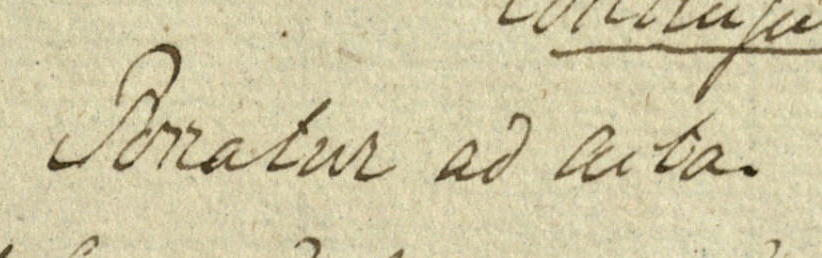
Ponatur ad Acta.
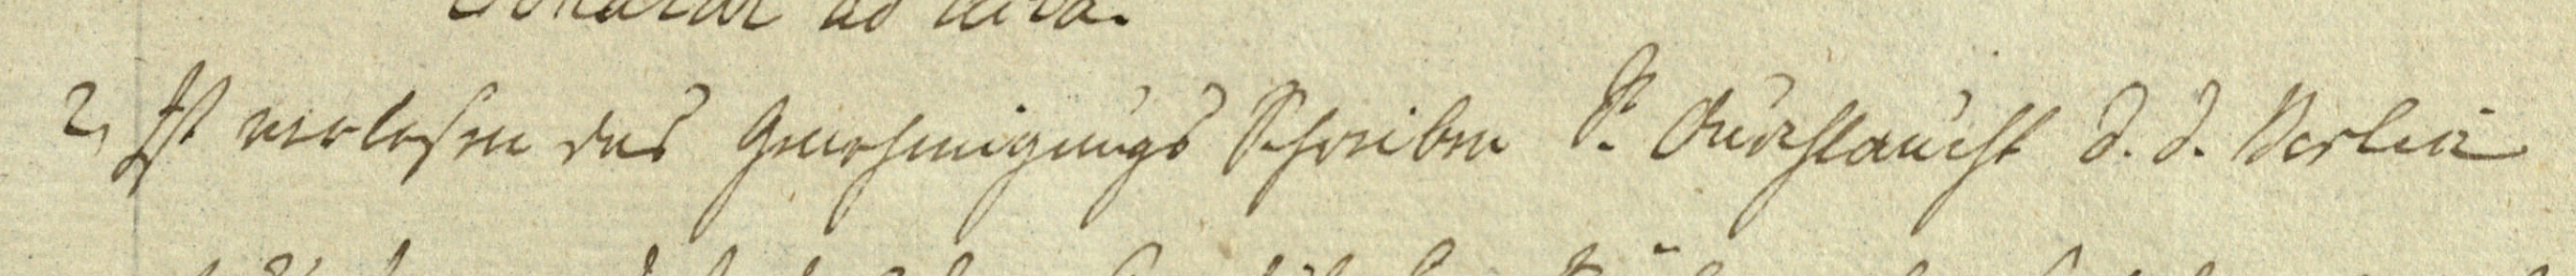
2, Ist verlesen das Genehmigungs Schreiben Sr. Durchlaucht d. d. Berlin
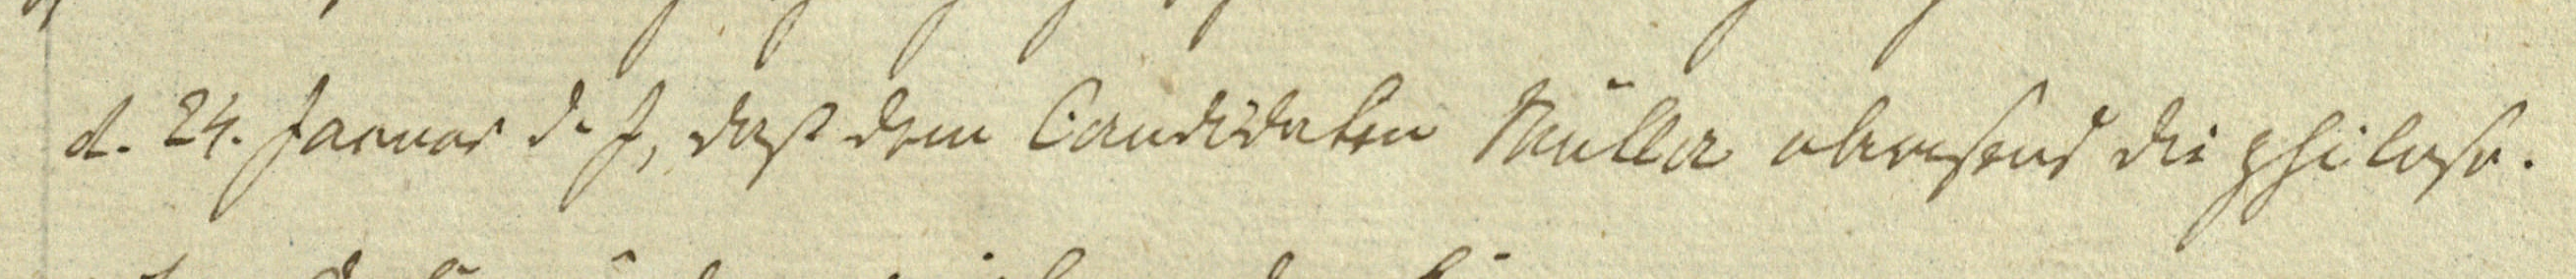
d. 24. Januar d. J, daß dem Candidaten Müller abwesend die philoso¬
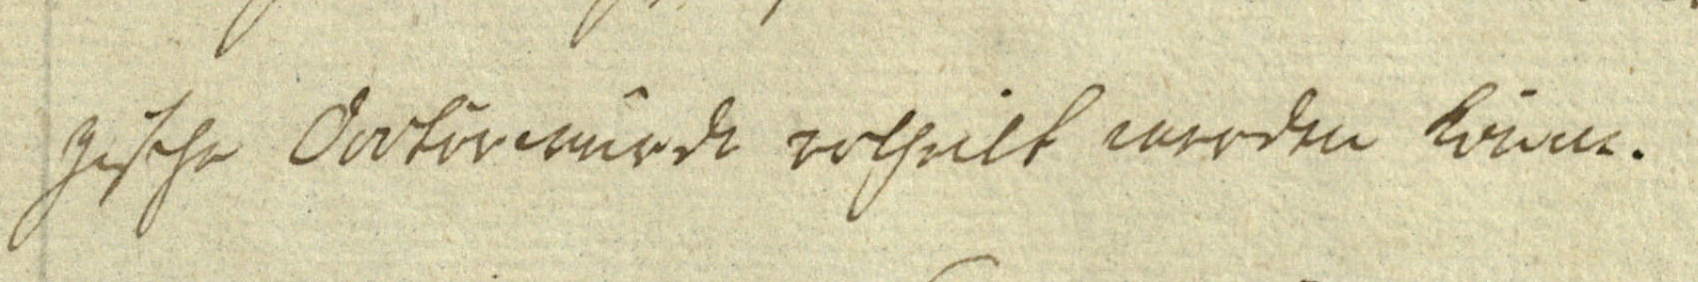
fische Doctorwürde ertheilt werden könne.
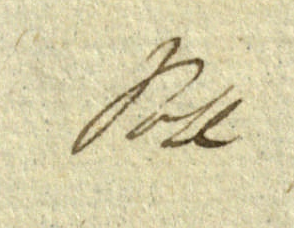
Soll
